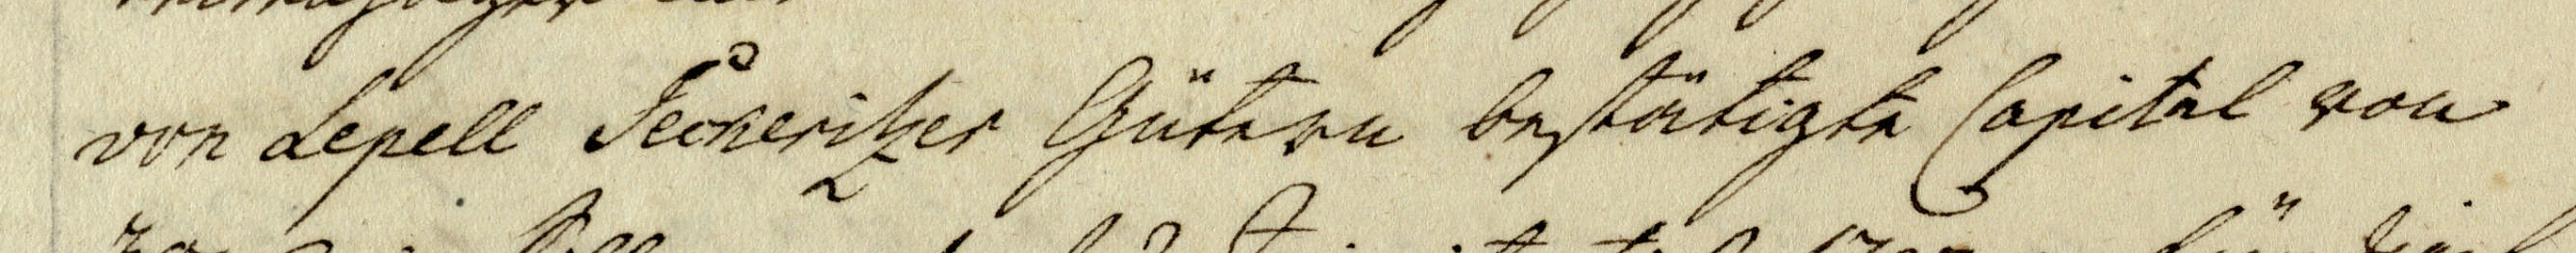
von Lepell Seckeritzer Gütern bestätigte Capital von
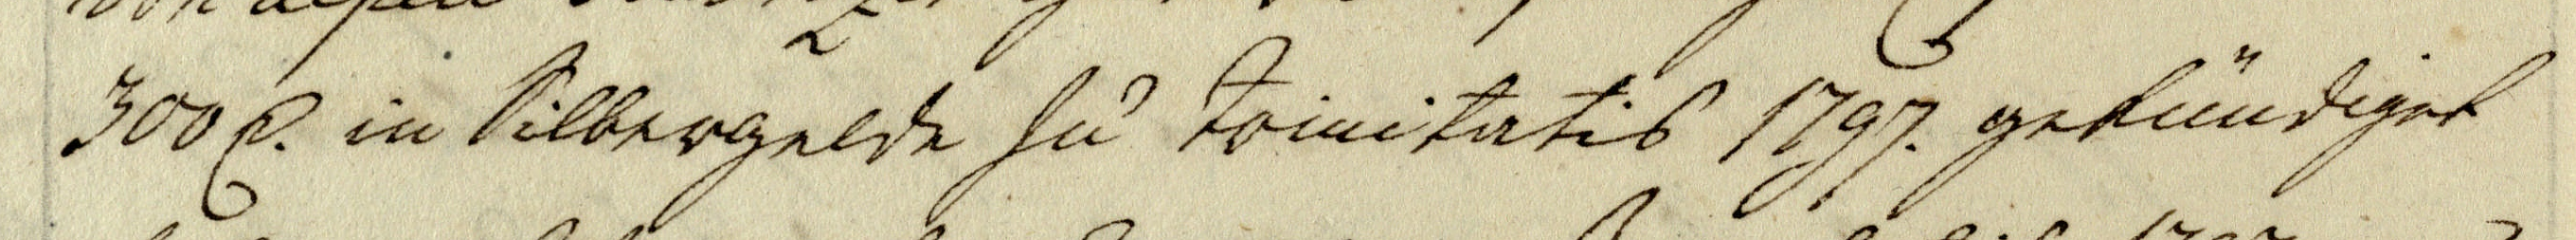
300 l. in Silbergelde zu Trinitatis 1797. gekündiget
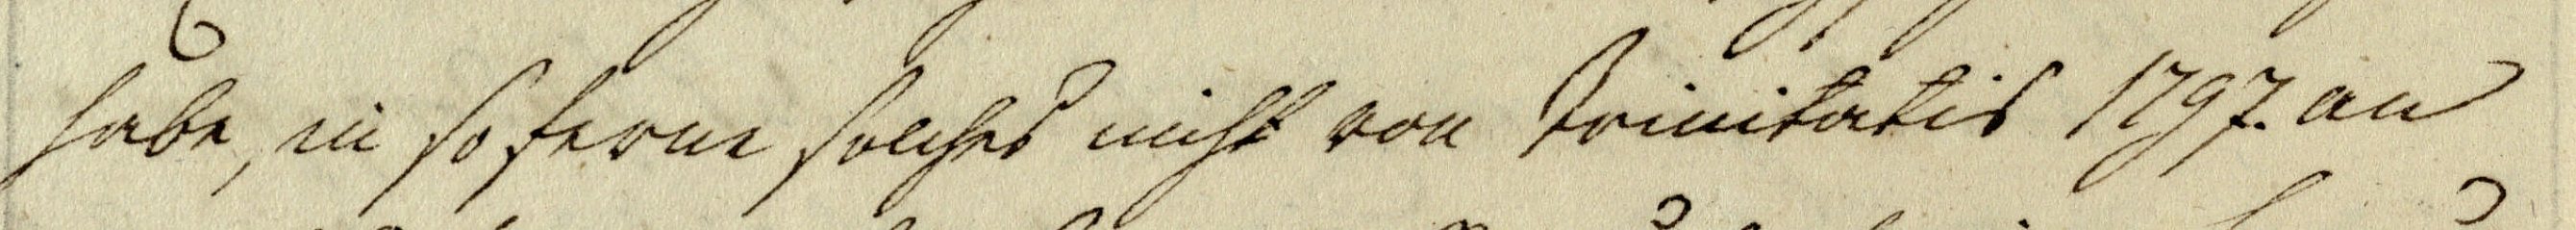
habe, in so ferne solches nicht von Trinitatis 1797 an
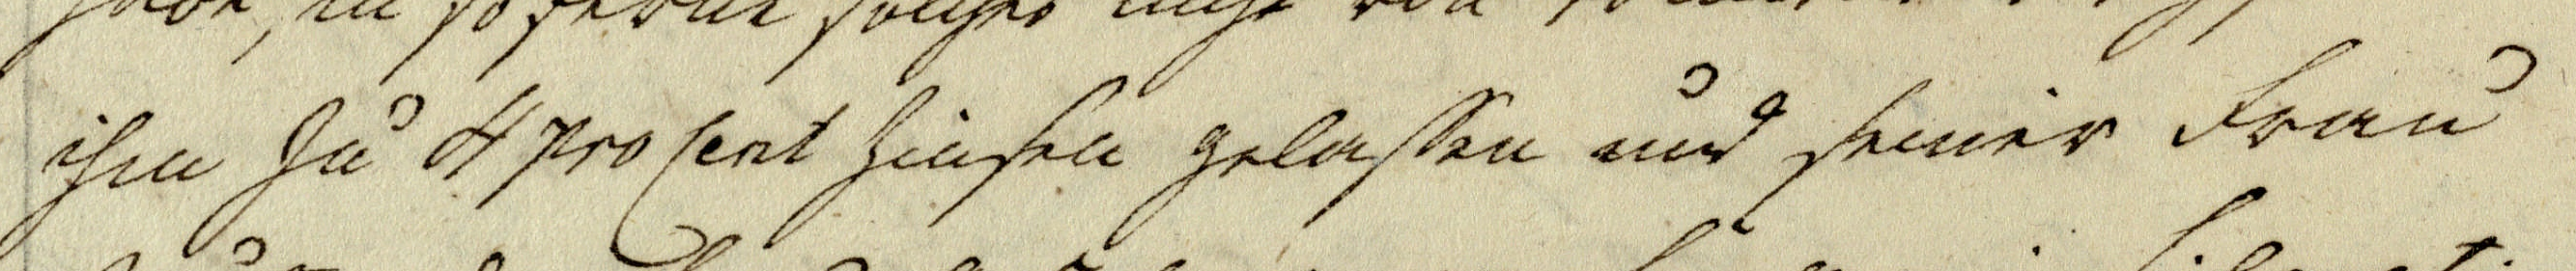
ihm zu 4 pro Cent Zinsen gelassen und seiner Frau
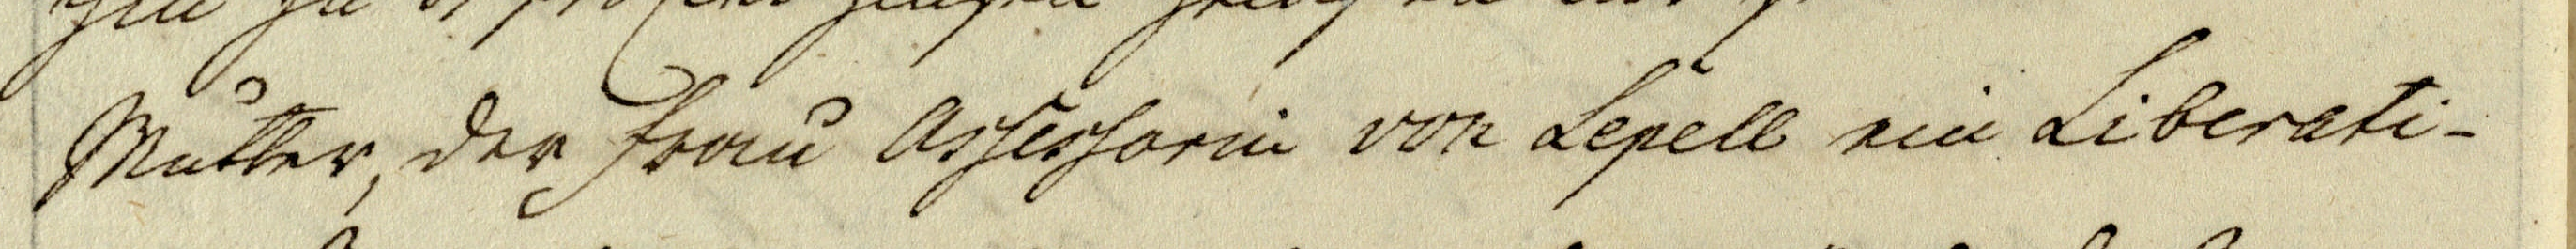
Mutter, der Frau Assessorin von Lepell ein Liberati¬
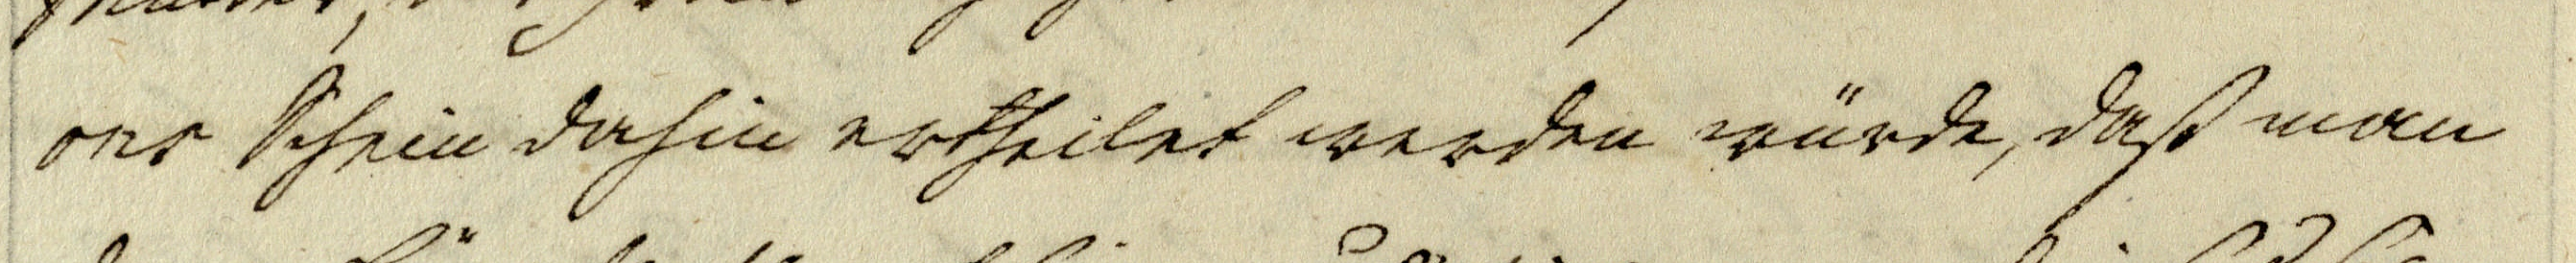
ons Schein dahin ertheilet werden würde, daß man
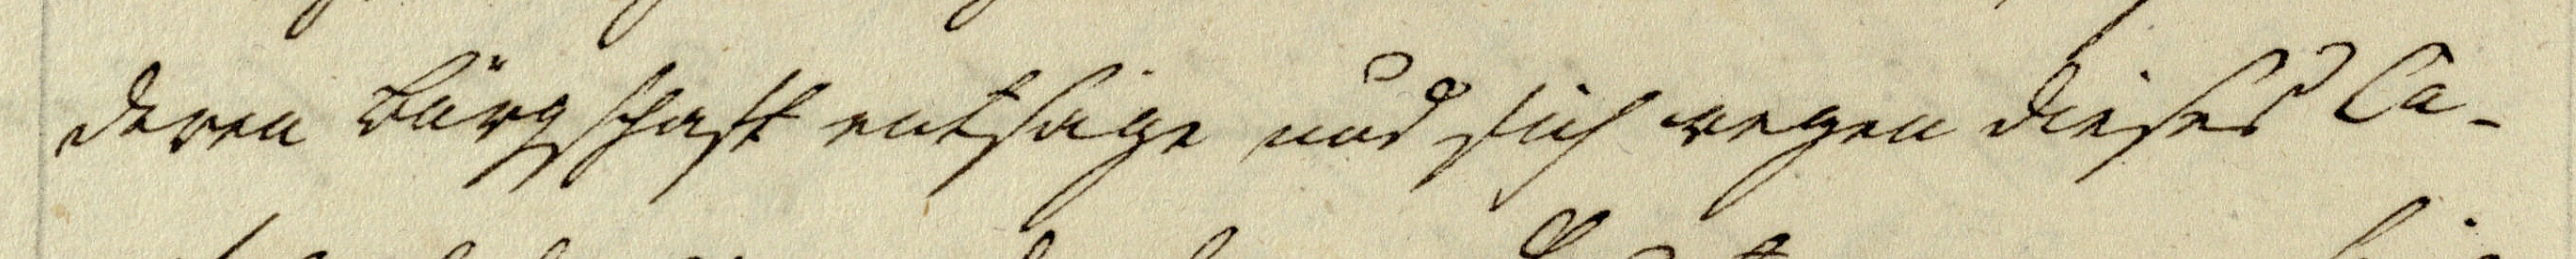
deren Bürgschaft entsage und sich wegen dieses Ca¬
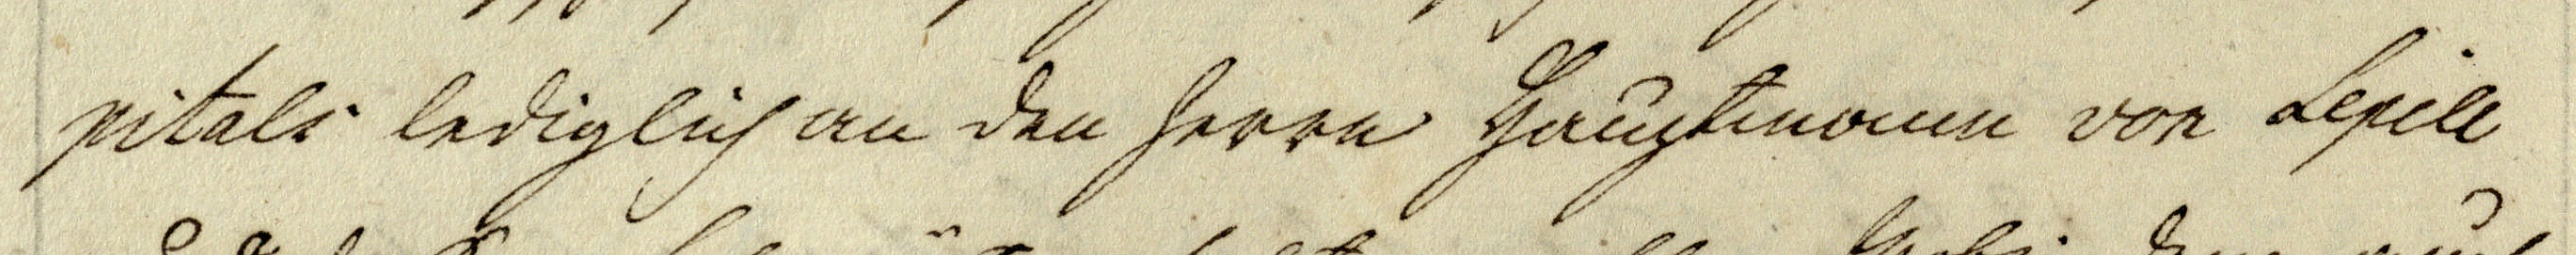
pitals lediglich an den Herrn Hauptmann von Lepell
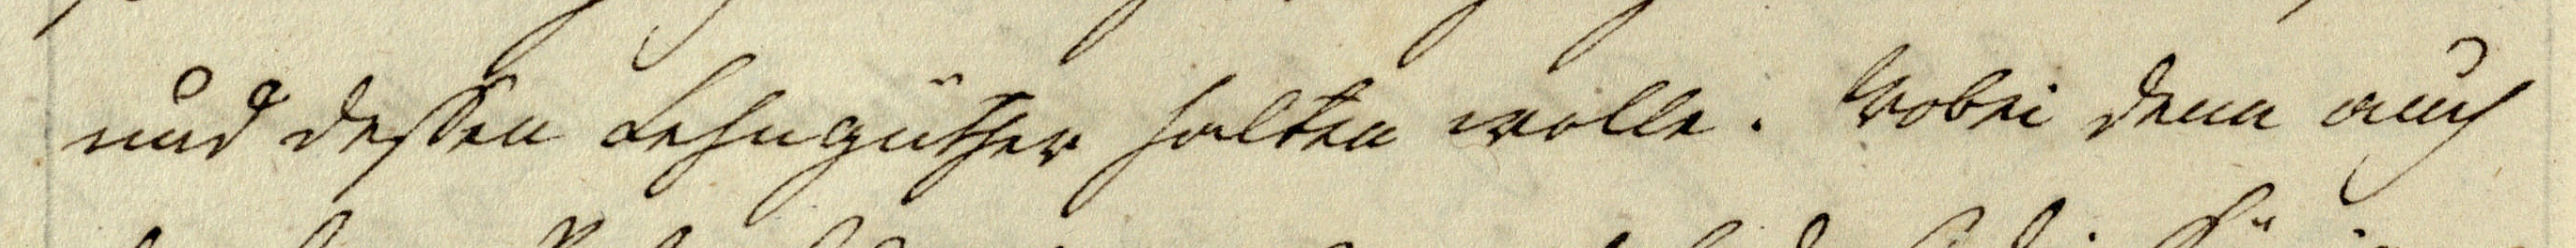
und dessen Lehngüther halten wolle. Wobei denn auch
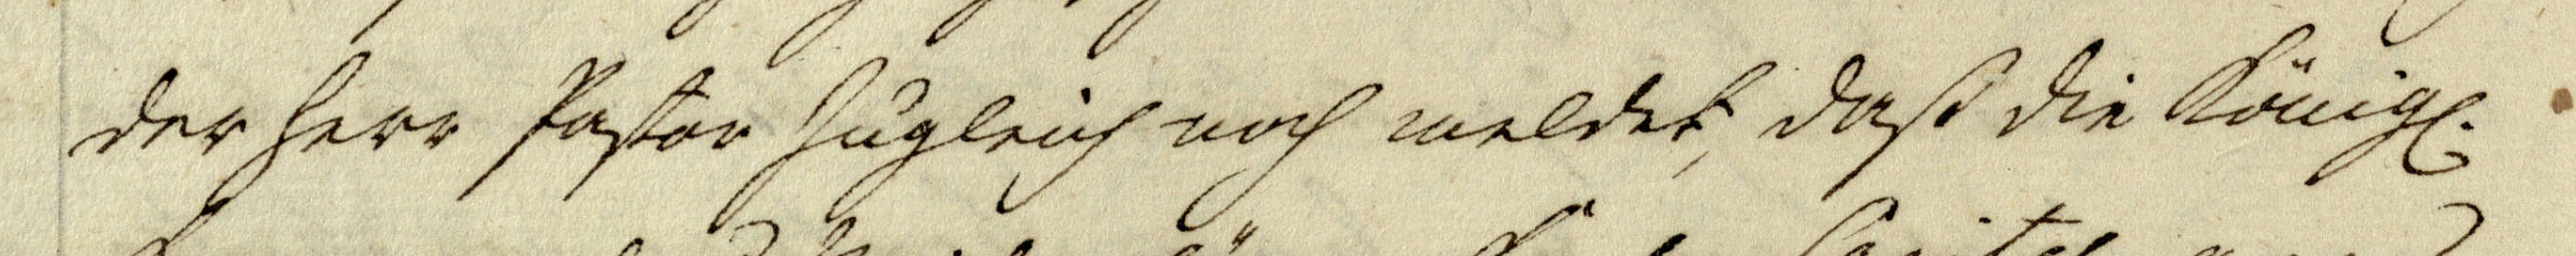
der Herr Pastor zugleich noch meldet, daß die Königl.
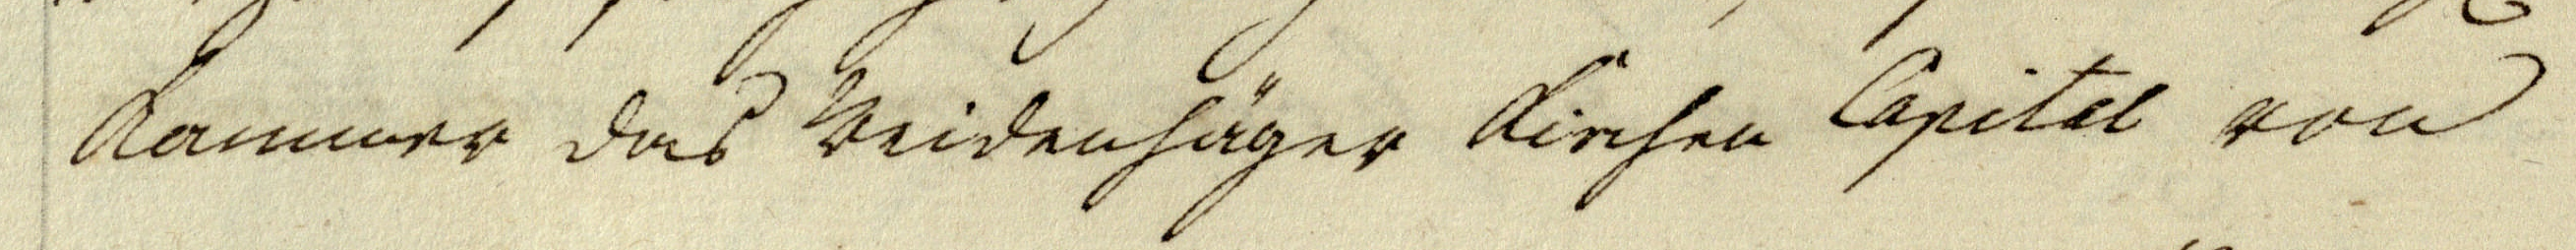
Kammer das Weidenhäger Kirchen Capital von
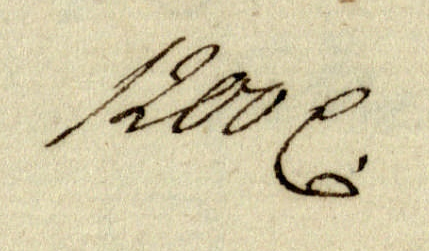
1200 l.
